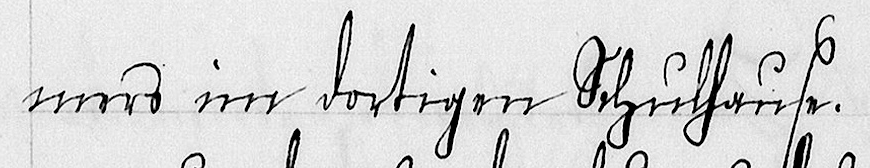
mer im dortigen Schulhause.
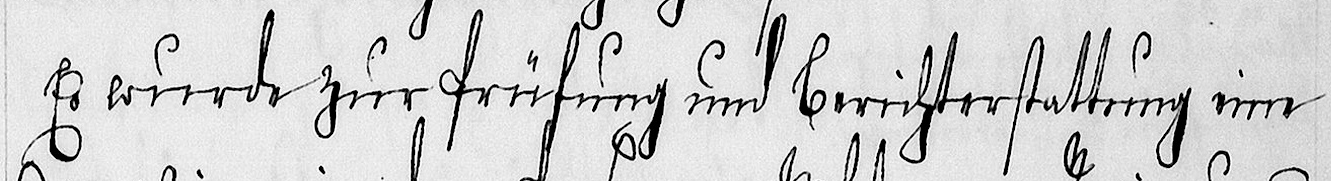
Es wurde zur Prüfung und Berichterstattung eine
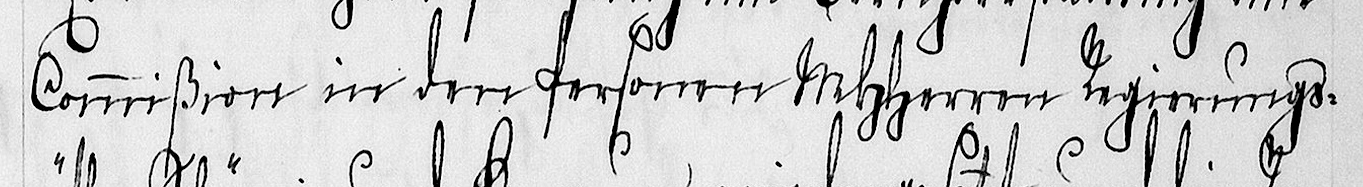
Commißion in den Personen MHHerren Regierungs¬
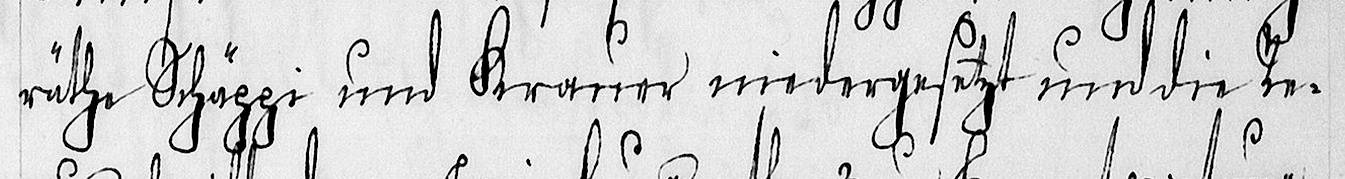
räthe Schäppi und Krauer niedergesetzt und die Re¬
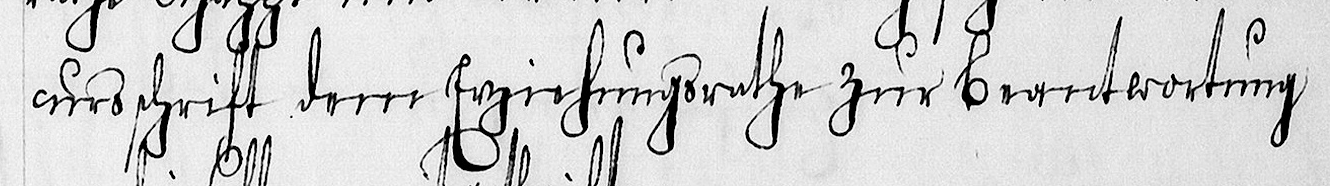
cursschrift dem Erziehungsrathe zur Beantwortung
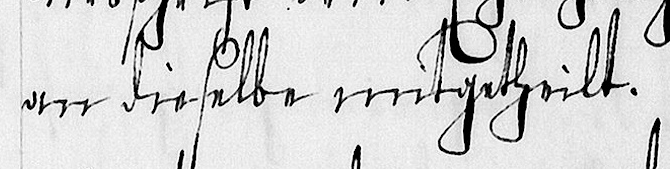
an dieselbe mitgetheilt.
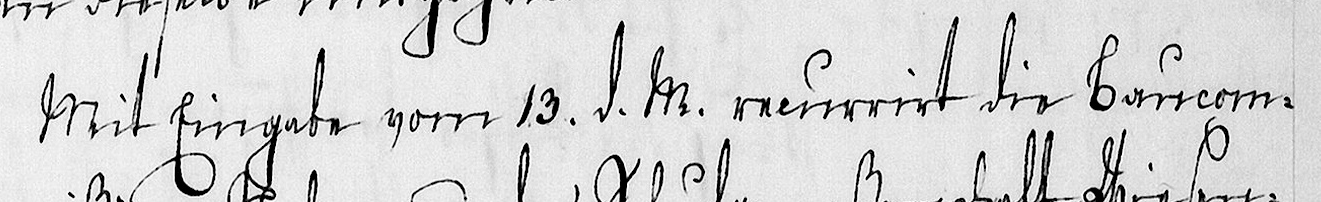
Mit Eingabe vom 13. d. M. recurrirt die Baucom¬
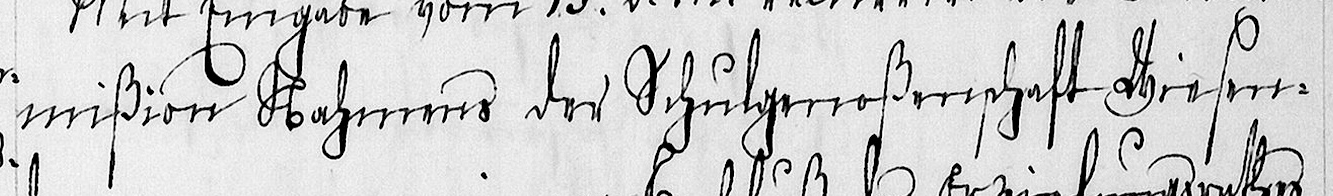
mißion Nahmens der Schulgenoßenschaft Wiesen¬
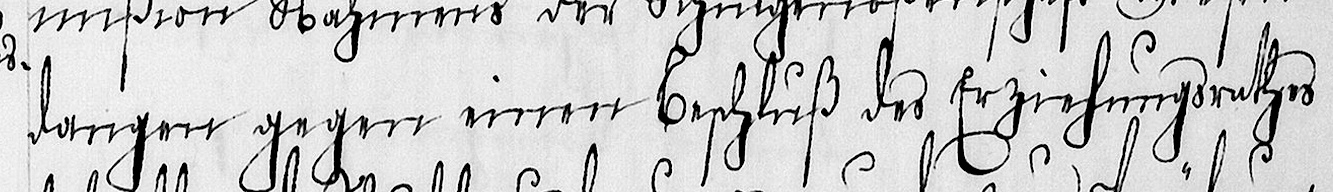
dangen gegen einen Beschluß des Erziehungsrathes
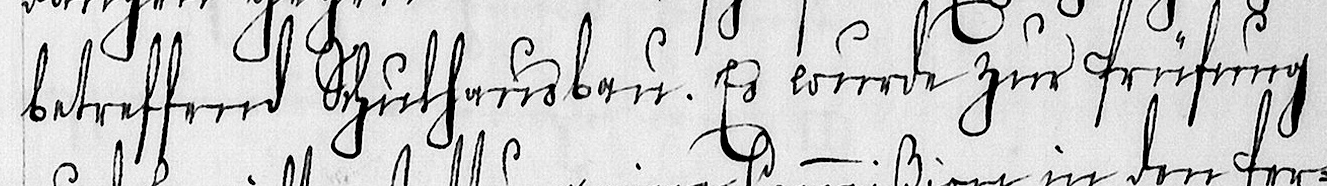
betreffend Schulhausbau. Es wurde zur Prüfung
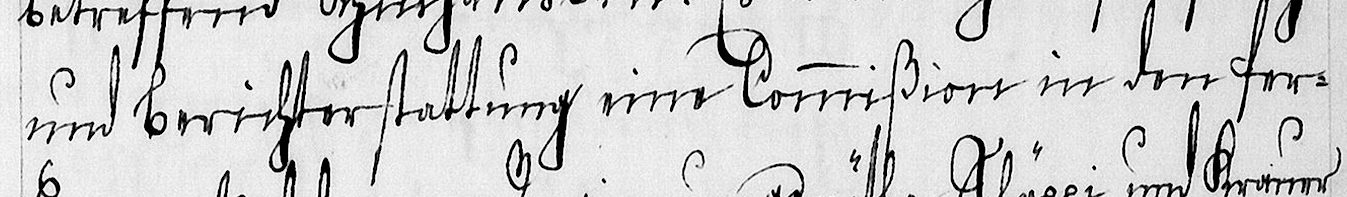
und Berichterstattung eine Commißion in den Per¬
